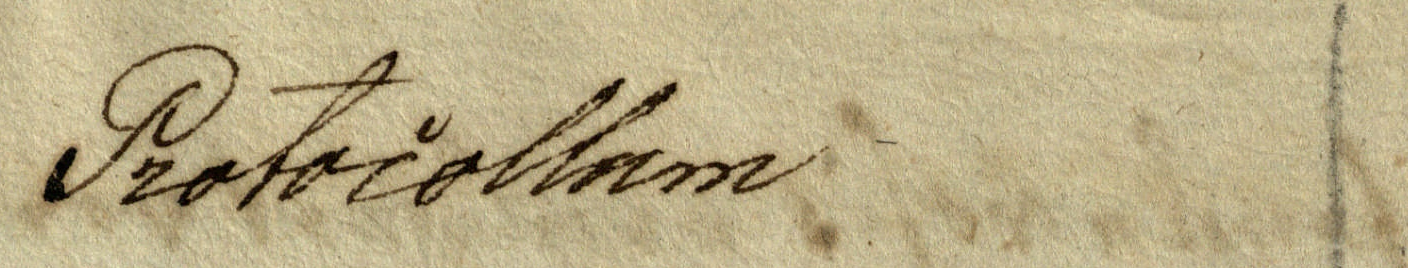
Protocollum
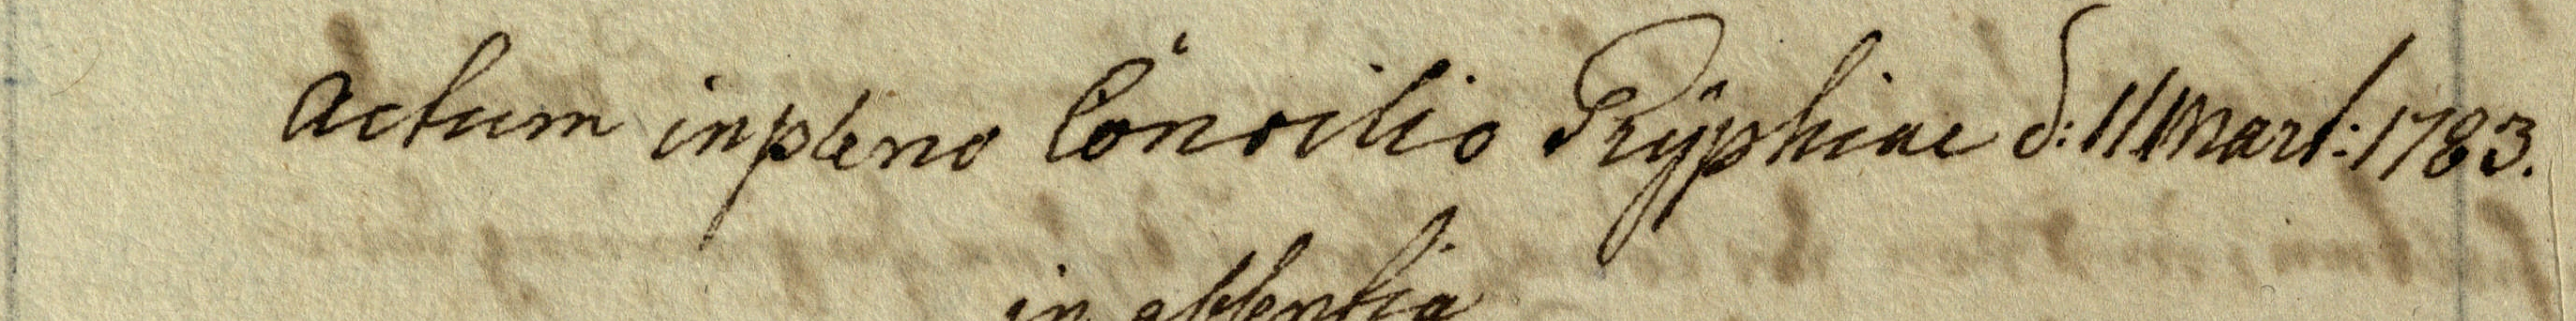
Actum in pleno Concilio Grÿphiae d. 11 Mart. 1783.
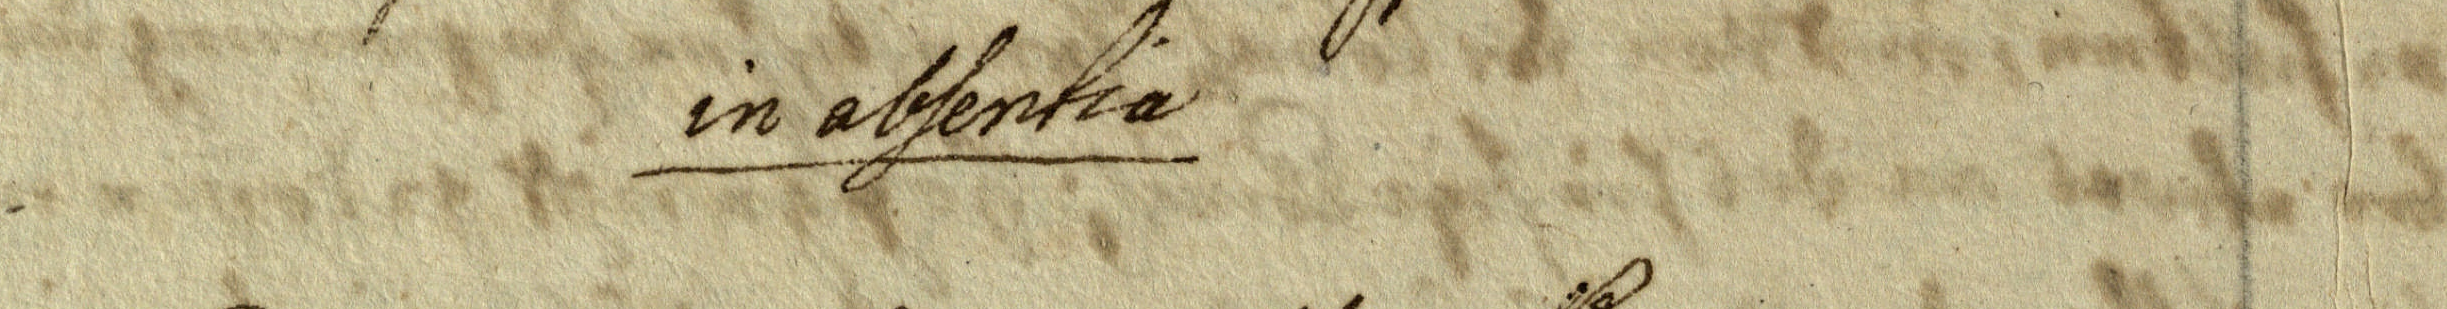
in absentia
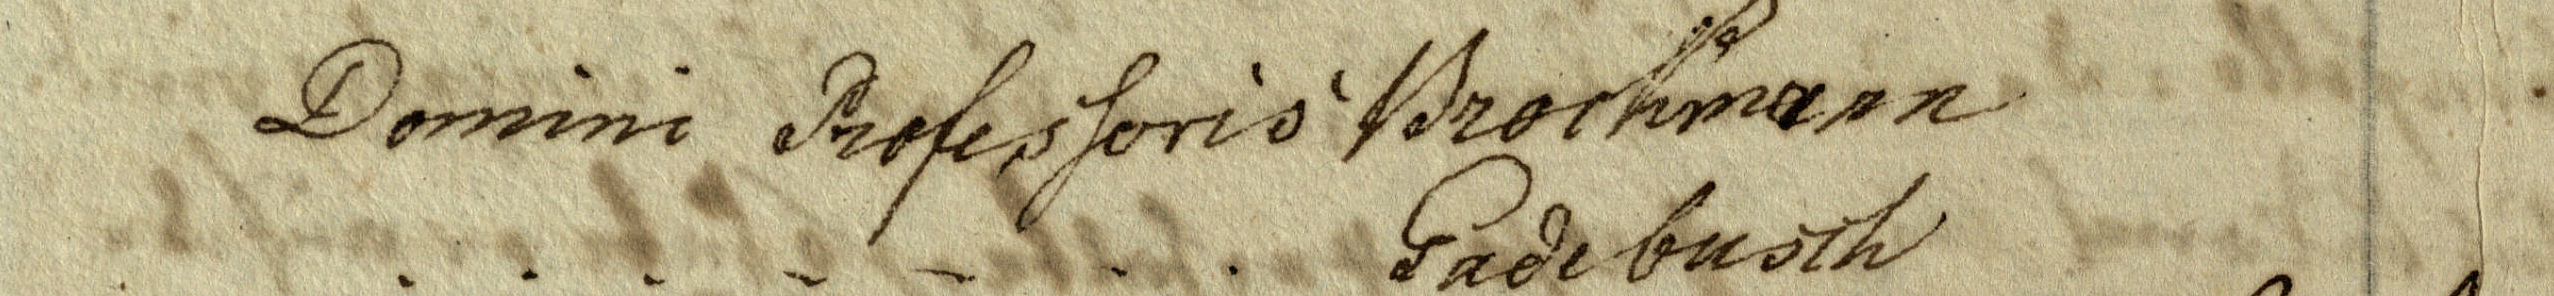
Domini Professoris Brockmann
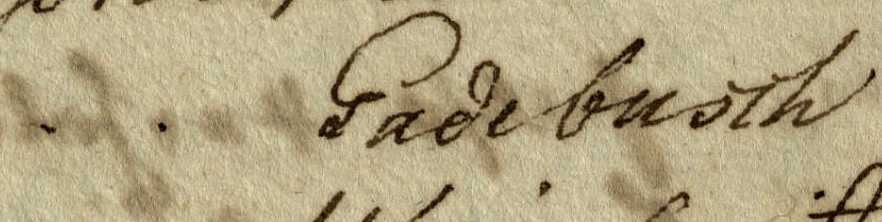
Gadebusch
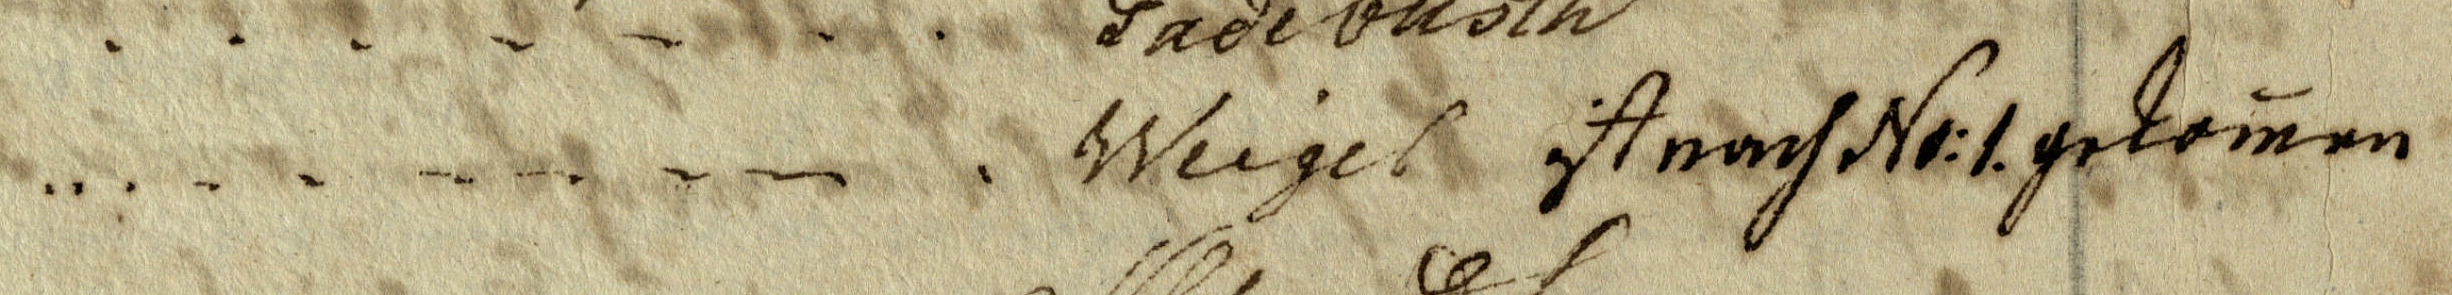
Weigel ist nach No 1. gekomen
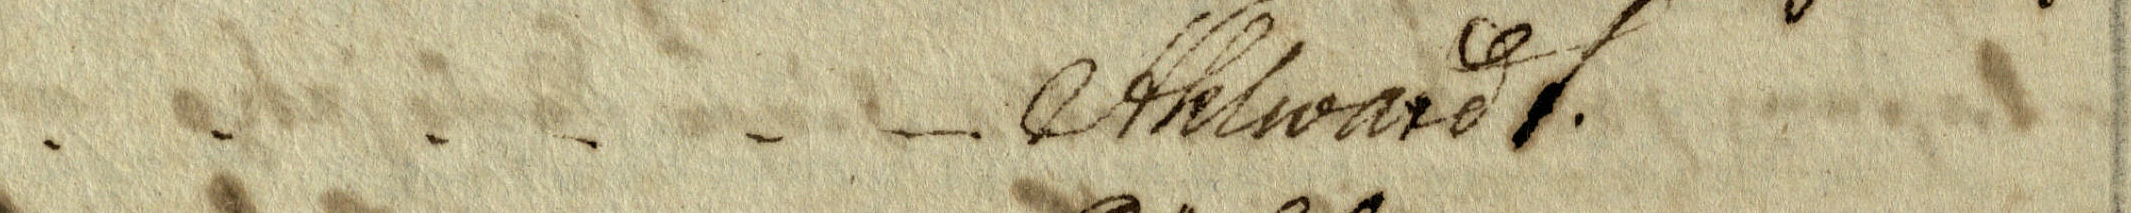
Ahlwardt.
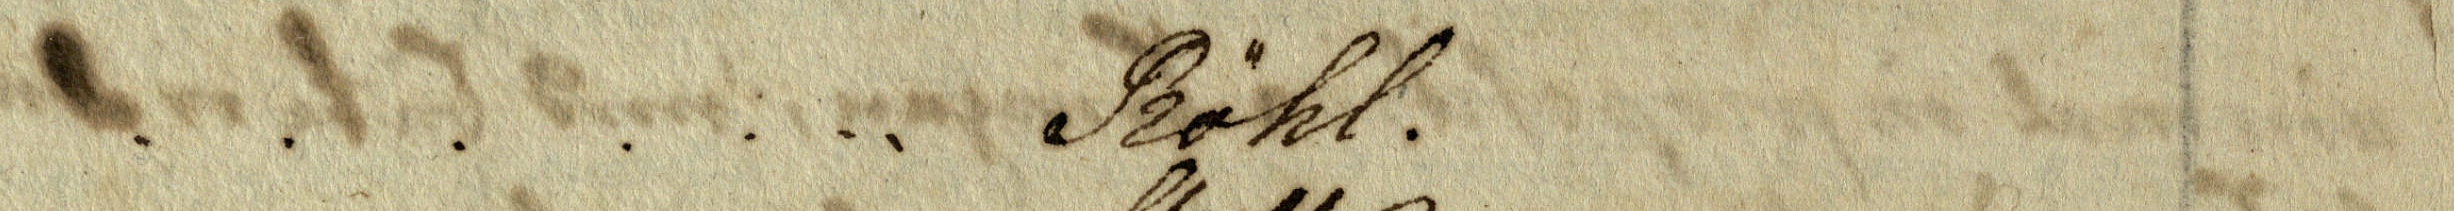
Röhl.
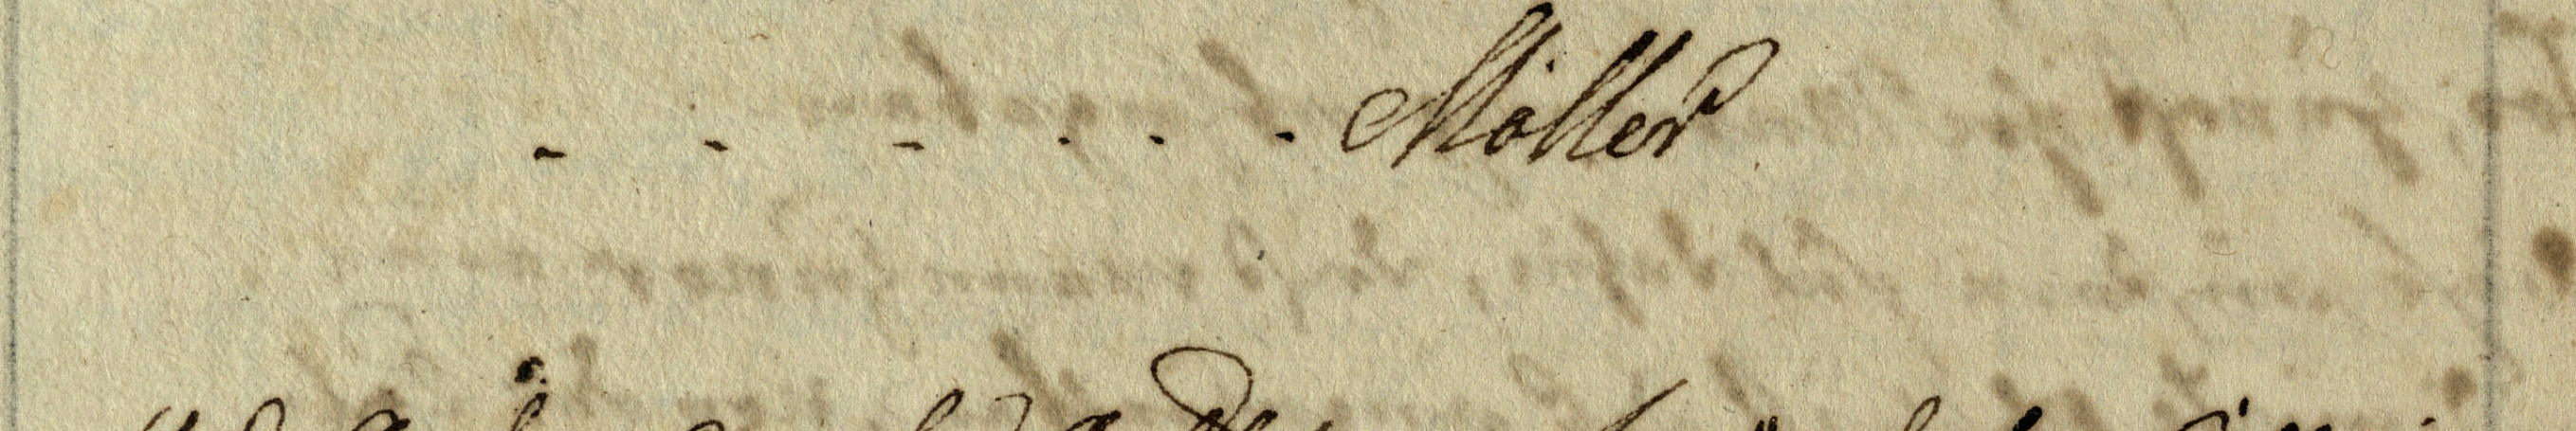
Möller
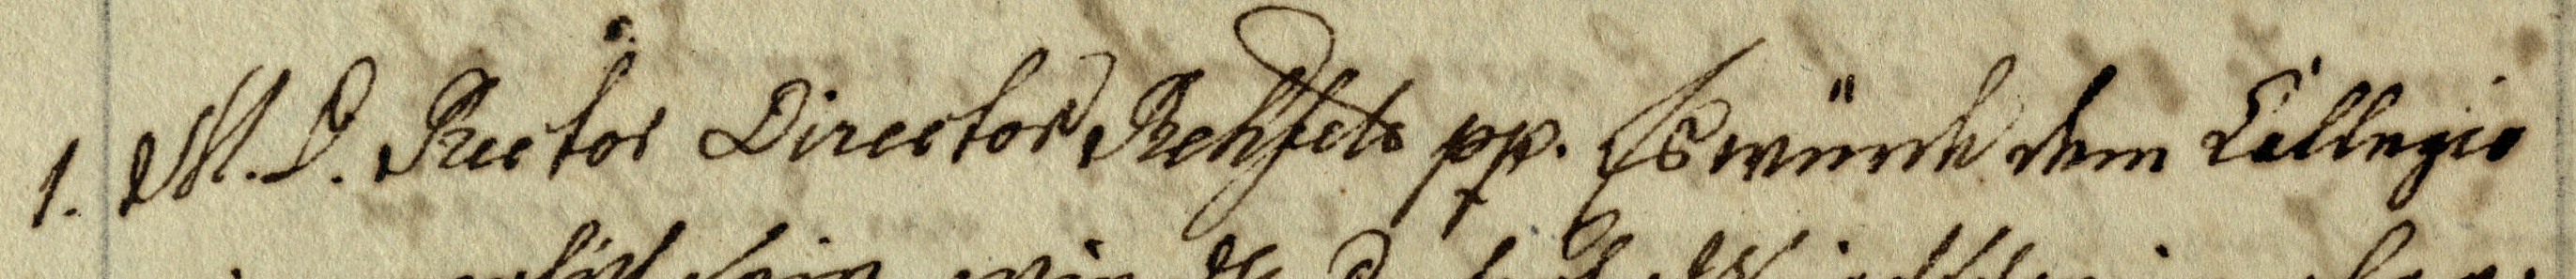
1. M. D. Rector Director Rehfeld pp. Es würde dem Collegio
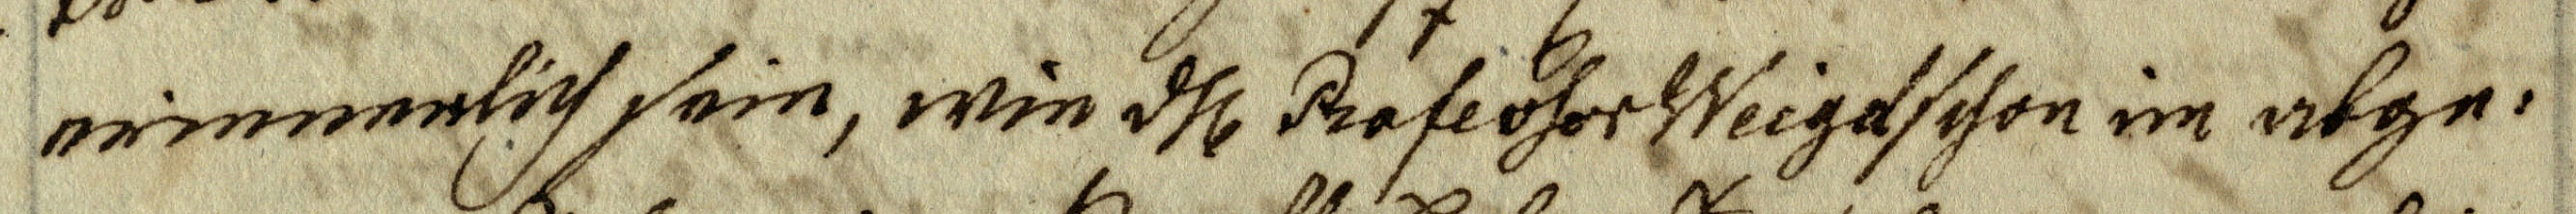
erinnerlich sein, wie dh Professor Weigel schon im abge¬
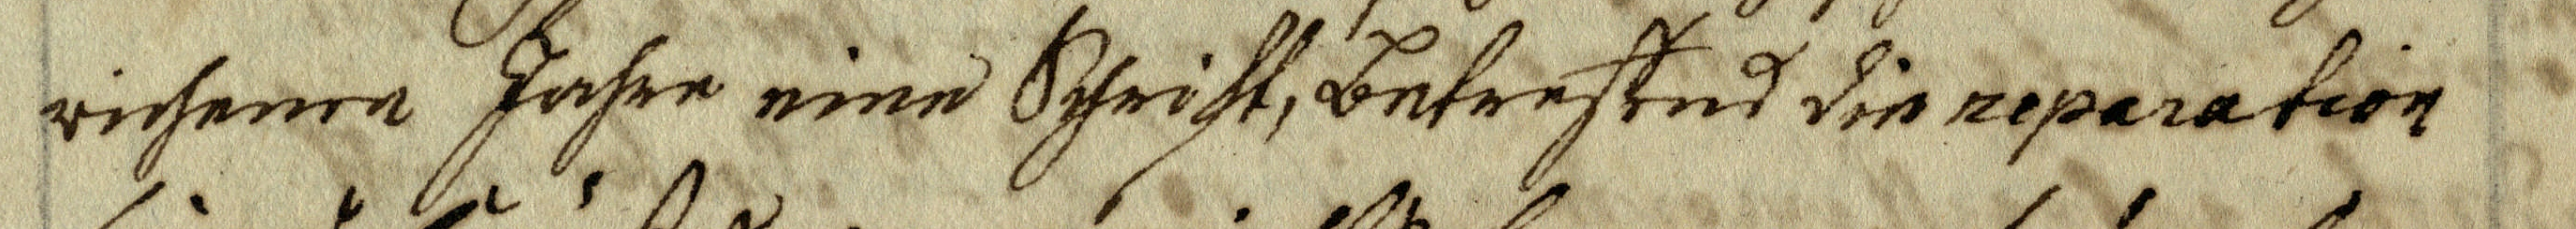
wichenen Jahre ein Schrift, betreffend die reparation
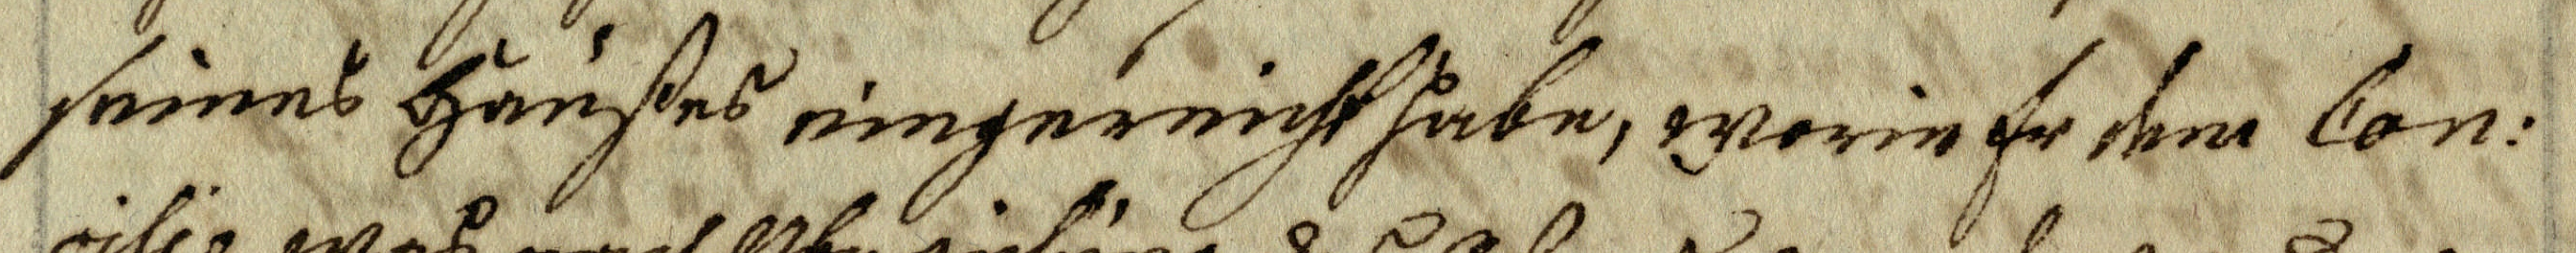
seines Hauses eingereicht habe, worin Er dem Con¬
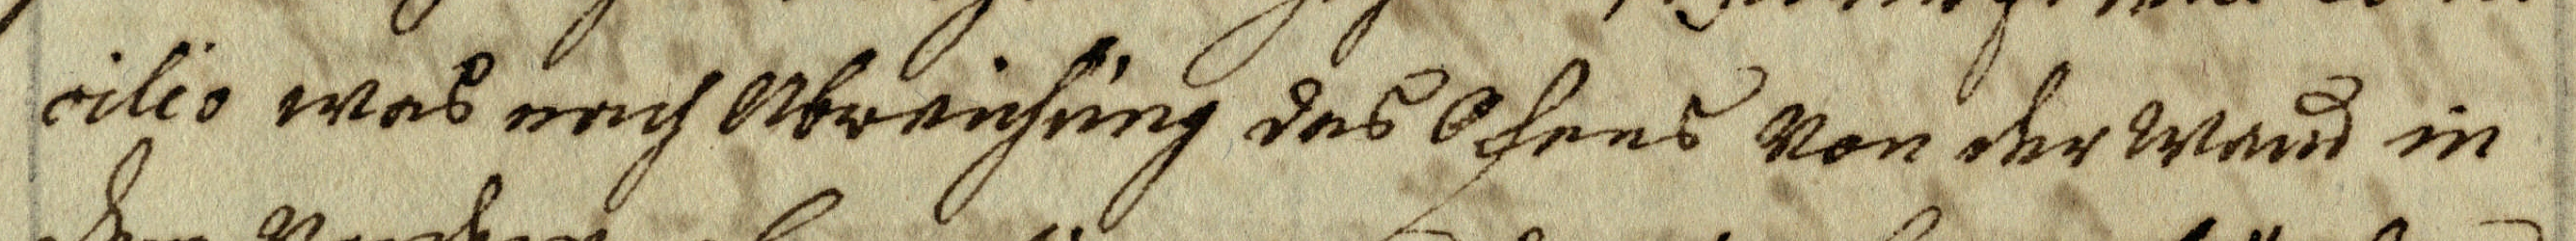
cilio was nach Abweichung des Ofens von der Wand in
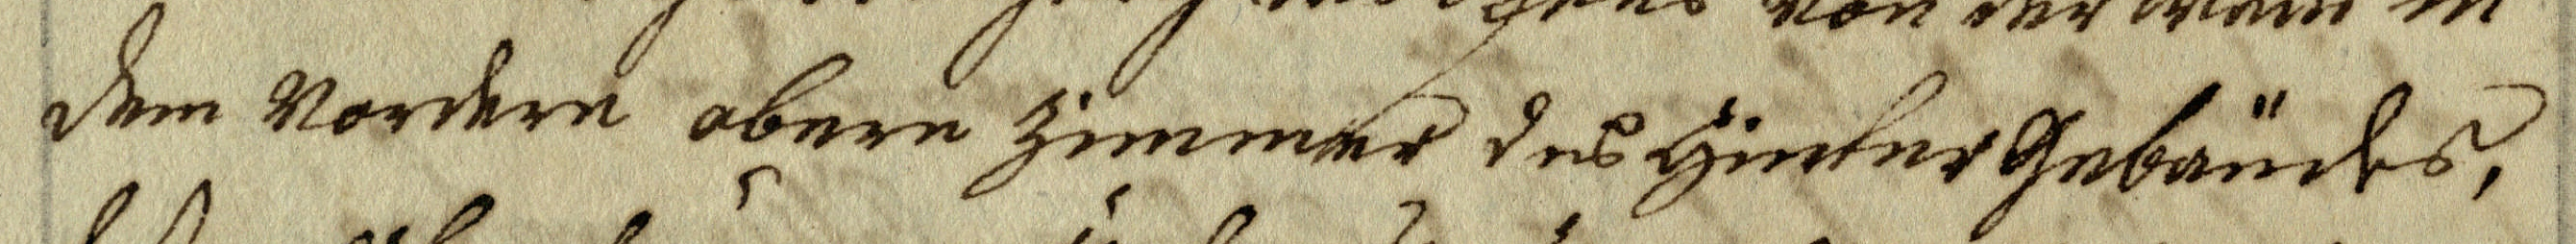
dem vordern obern Zimmer des HinterGebäudes,
